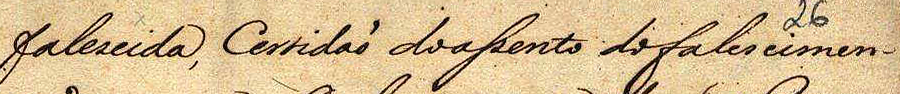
falescida Certidaõ do assento do falescimen
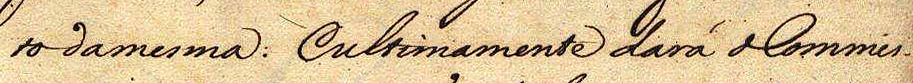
to da mesma: E ultimamente dará o Commis
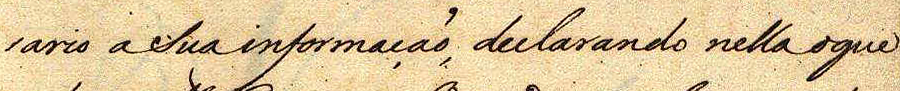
sario a sua informação, declarando nella o que
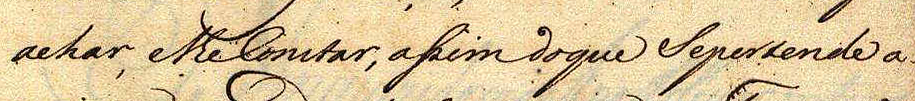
achar, e lhe Constar, assim do que se pertende a
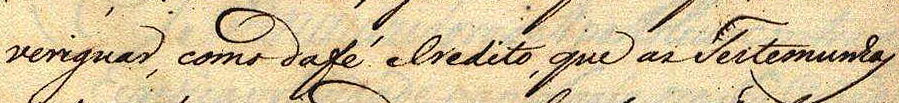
veriguar como da fé e Credito, que az Testemunhas
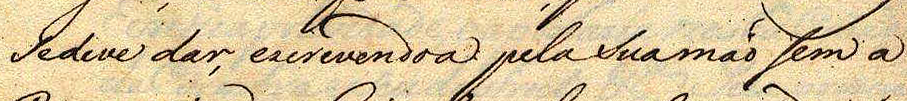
se deve dar, escrevendoa pela sua maõ sem a
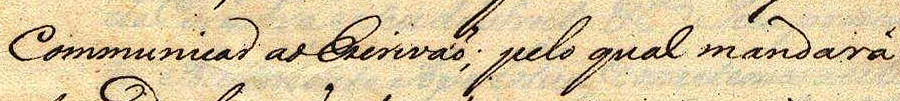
Communicar ao Escrivaõ; pelo qual mandará
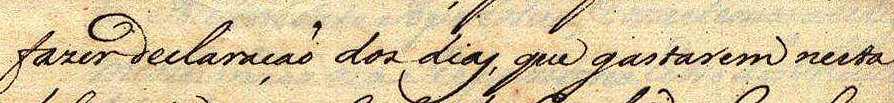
fazer declaraçaõ dos dias, que gastarem nesta
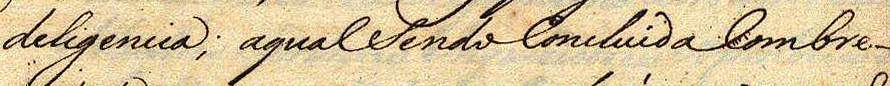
deligencia; a qual sendo Concluida Com bre
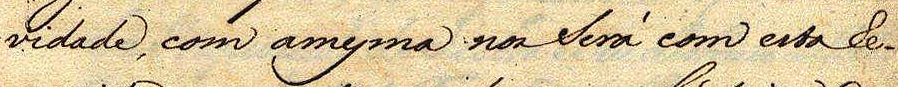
vidade, com a mesma noz Será com esta Re
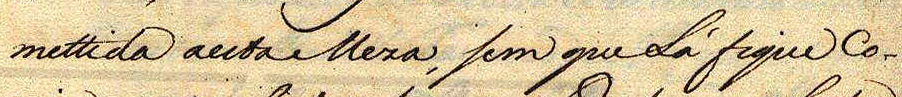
mettida a esta Meza, sem que Lá fique Co
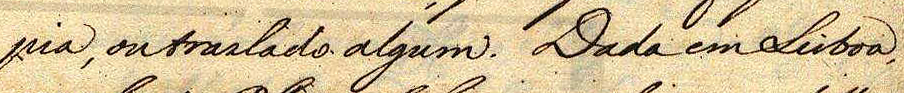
pia, ou traslado algum. Dada em Lisboa,
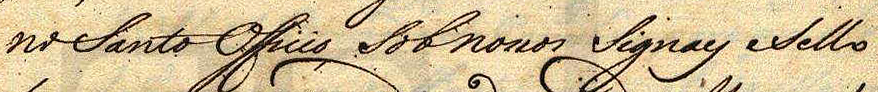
no Santo Officio, sob nossos Signaes e sello
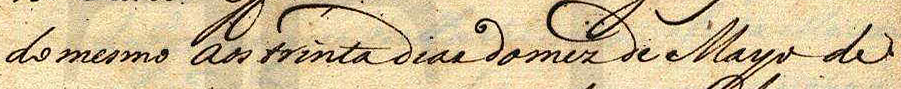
do mesmo aos trinta dias do mez de Mayo de
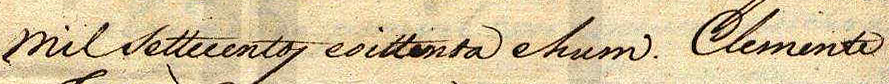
mil settecentos e oittenta, e hum. Clemente
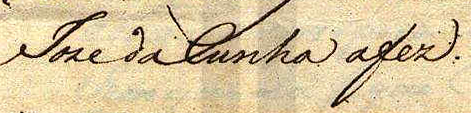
Ioze da Cunha a fez.
